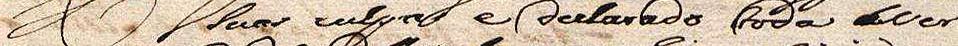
suas culpas e declarado toda a ver
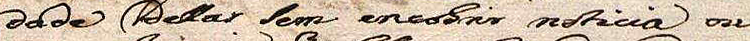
dade dellas sem encobrir noticia ou
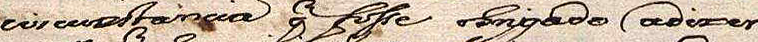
circunstancia q̄ fosse obrigada a dizer
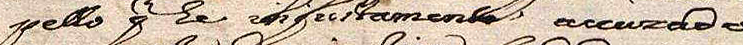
pello q̄ he injustamente accuzado
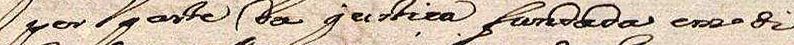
por parte da justiça fundada em o di
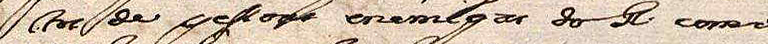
tos de pessoas enimigas do R. como
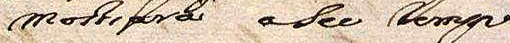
mostraraõ a Seu tempo.
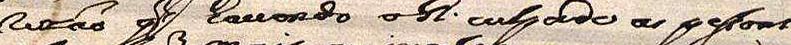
rezaõ q̄ hauendo o R. culpado as pessoas
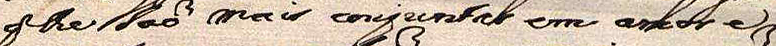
q̄ lhe saõ mais conjuntas em amor e
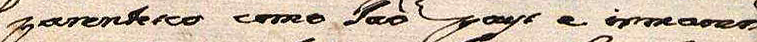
parentesco como saõ pays e irmaons
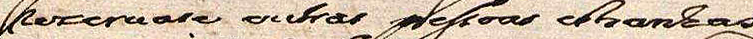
rezeruase outras pessoas estranhas
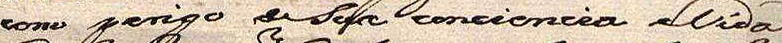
como perigo de sua conciencia a Vida
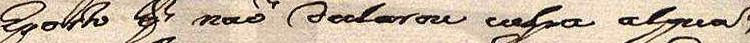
E posto q̄ naõ declarou culpa alguā
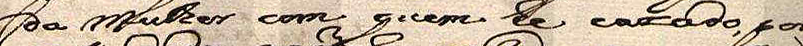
da mulher com quem he cazado, por
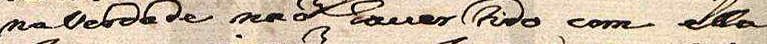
na verdade naõ hauer tido com ella
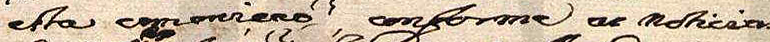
esta comonicaçaõ, conforme as noticias
